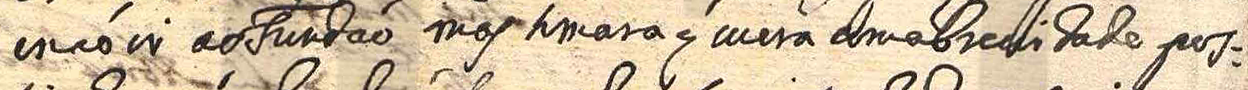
e naõ ir ao Fundaõ mas tomara q̄ uiera com a breuidade pos
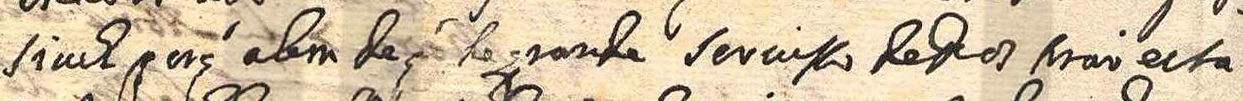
siuel porq̄ alem de q̄ he grande seruisso de Deos tirar esta
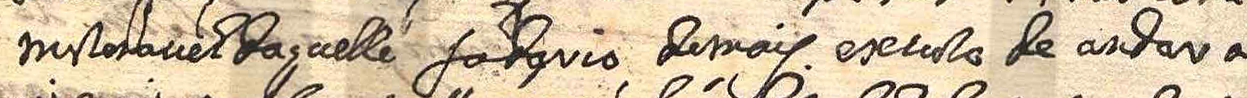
miserauel daquelle sudario de mais excuzo de andar a
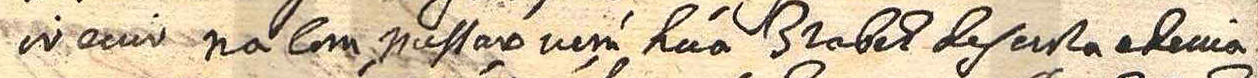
ir e uir na commissaõ uem huā Izabel de souza e deuia
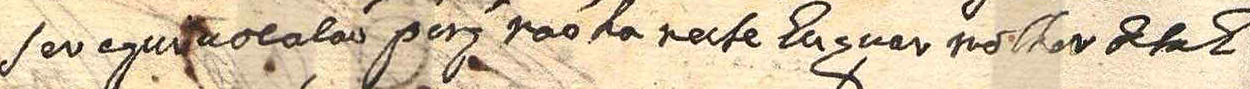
ser equiuocaçaõ porq̄ naõ ha neste luguar molher de tal
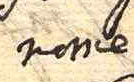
nome
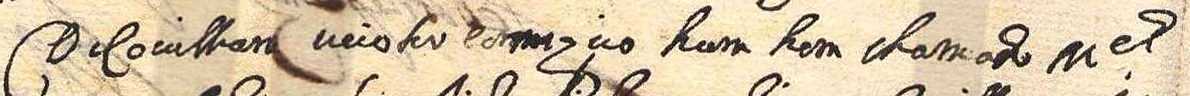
De Couilham ueio ter comiguo hum hom chamado Me.l
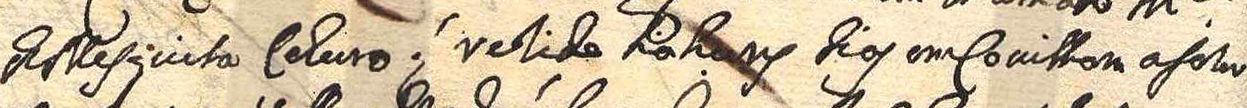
de Mesquita Celeiro q̄ rezide ha huns dias em Couilham a fazer
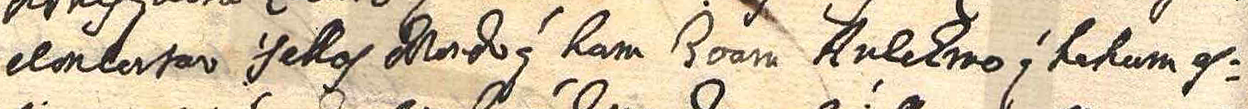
e concertar sellas dizendo q̄ hum Ioam Ancelmo q̄ he hum es
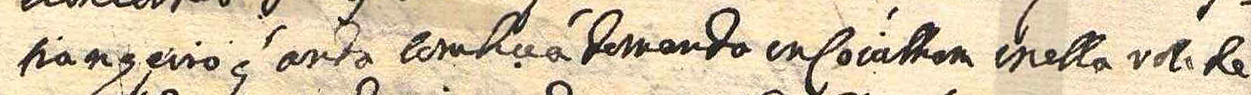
trangeiro q̄ anda com huā demanda en Couilham e nella rezide
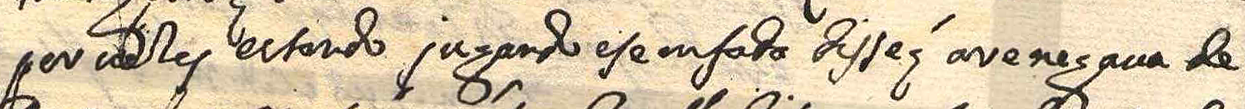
per uezes estando jugando e sem fado disse q̄ arenegaua de
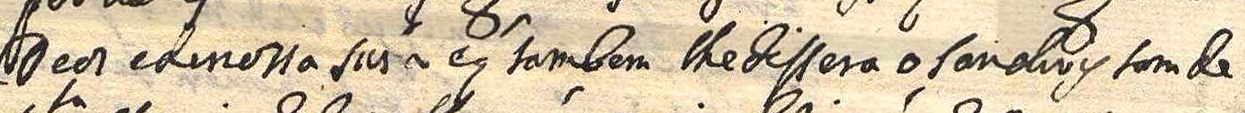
Deos e de nossa snra e q̄ tambem lhe dissera o sanchristam de
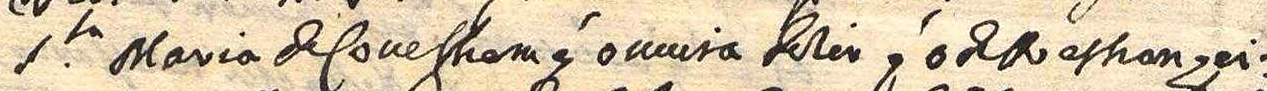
S.ta Maria de Couelham q̄ ouuira dizer q̄ o ditto estrangei
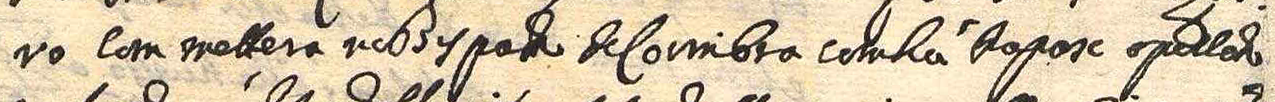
ro commettera no Bispado de Coimbra com hū rapax o peccado
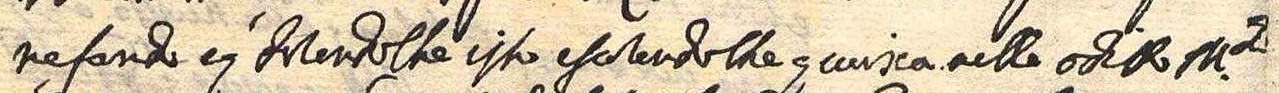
nefando e q̄ dizendolhe isto e fazendolhe queixa a elle o ditto M.el
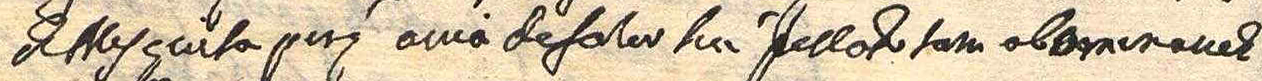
de Mesquita porq̄ auia de fazer hū peccado tam abominauel
